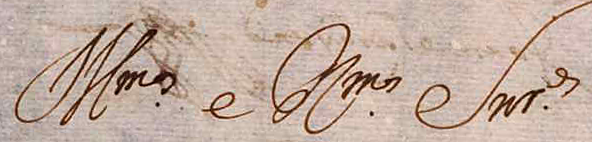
Ill.mos e R.mos Snr.es
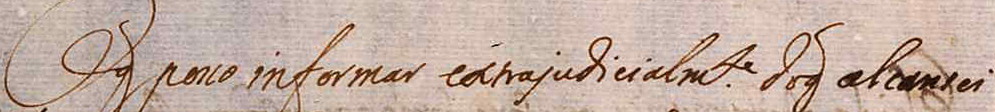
O q̄ posso informar extrajudicialm.te do q̄ alcansei
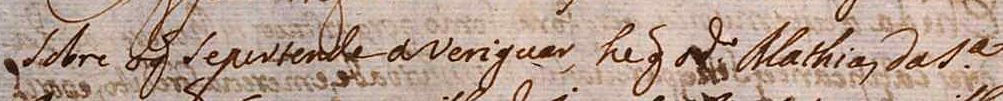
sobre o q̄ se pertende averiguar, he q̄ o d.o Mathias da S.a
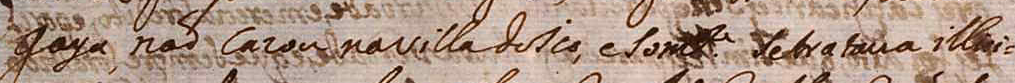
Gaya, naõ cazou na villa de Ico, e somt.e se trataua illisi
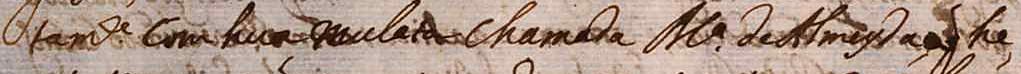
tam.te com hua mulata chamada M.a de Almeyda, a q̄ he
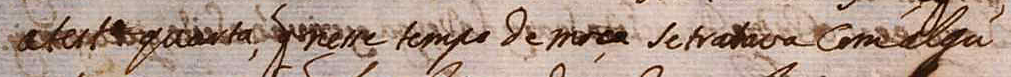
a testa quarta, q̄ nesse tempo de moça se tratava com algū
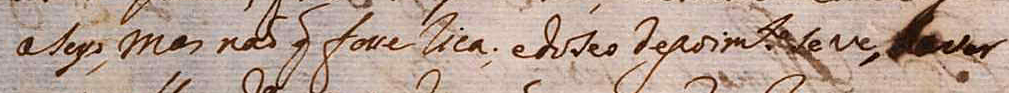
aseyo, mas naõ q̄ fosse Rica; e do seo depoim.to se ve, haver
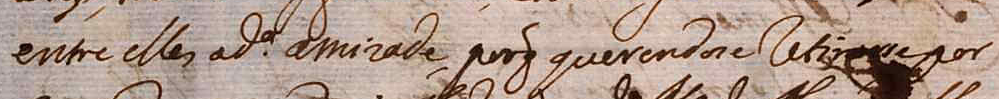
entre elles a d.a amizade, porq̄ querendose Retirarse por
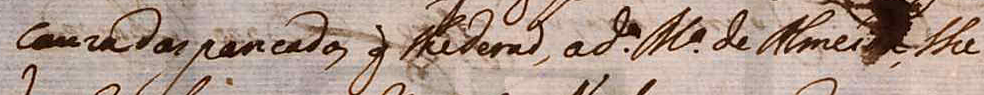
cauza das pancadas q̄ lhe deraõ, a d.a M.a de Almeida, lhe
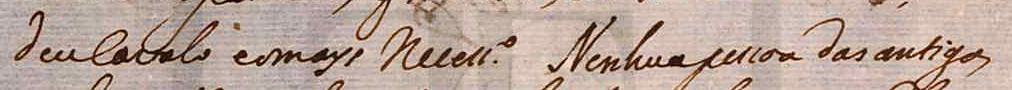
deu cavalo, e o mays Necess.o Nenhua pessoa das antigas
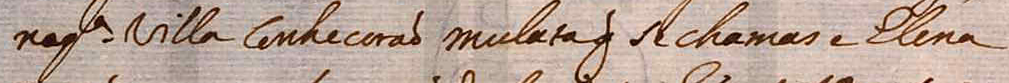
naq.la villa Conheceraõ mulata q̄ se chamase Elena
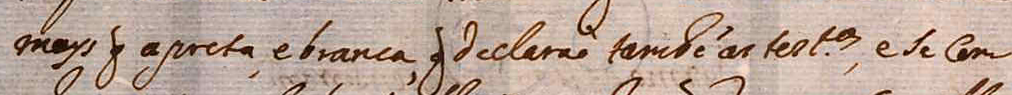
mays q̄ a preta, e branca, q̄ declaraõ tambē as test.as, e se com
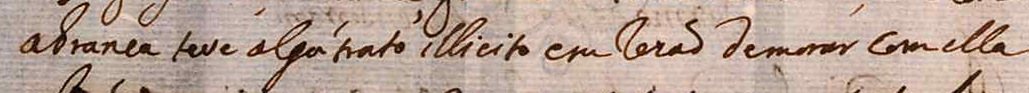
a branca teve algū trato illicito em rezaõ de morar com ella
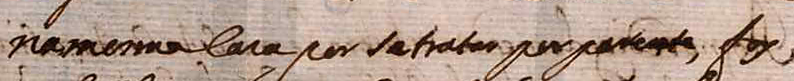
na mesma Caza por se tratar por parente, foy
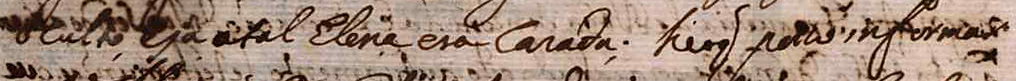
oculto, e ja a tal Elena era Cazada; he o q̄ posso informar
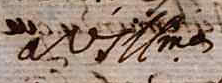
a V Illm.as
